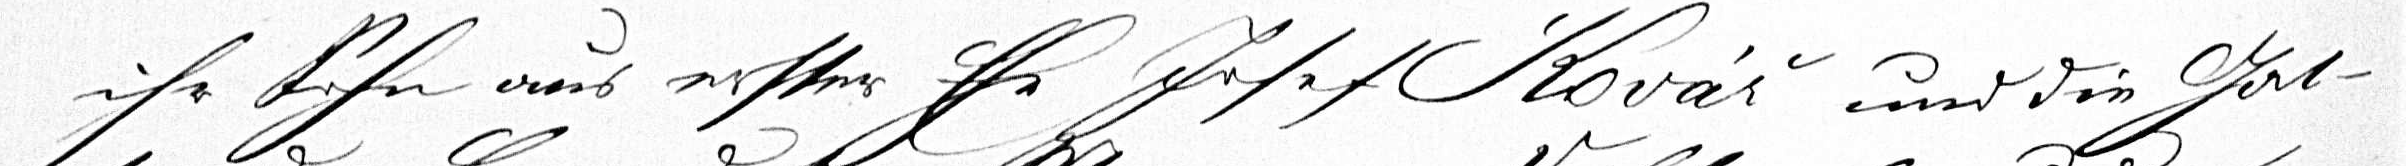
ihr Sohn aus erster Ehe Josef Kovár und die Gat¬
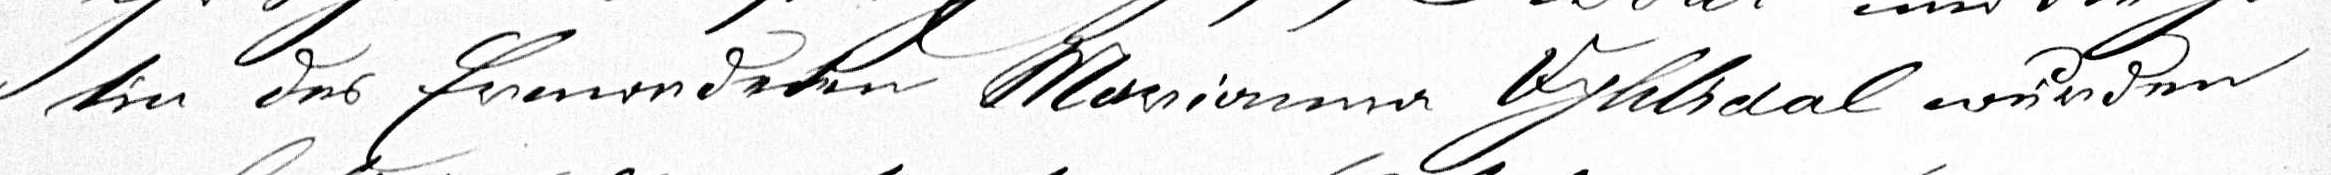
tin des Ermordeten Marianna Vyhlidal wurden
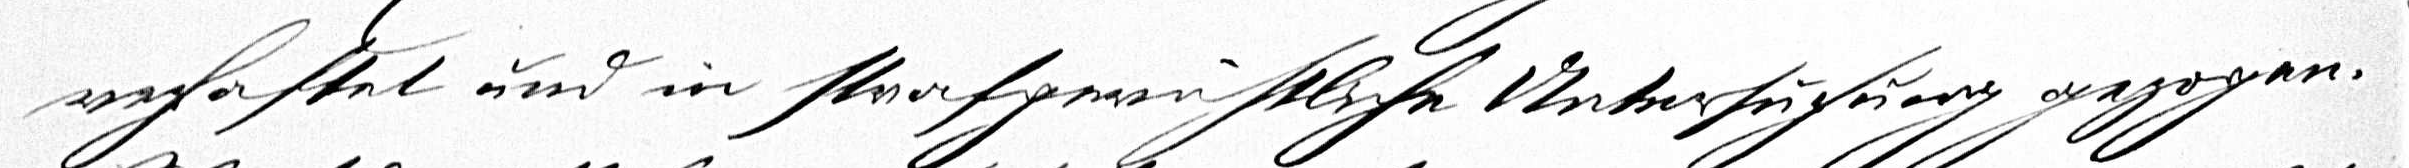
verhaftet und in strafgerichtliche Untersuchung gezogen.
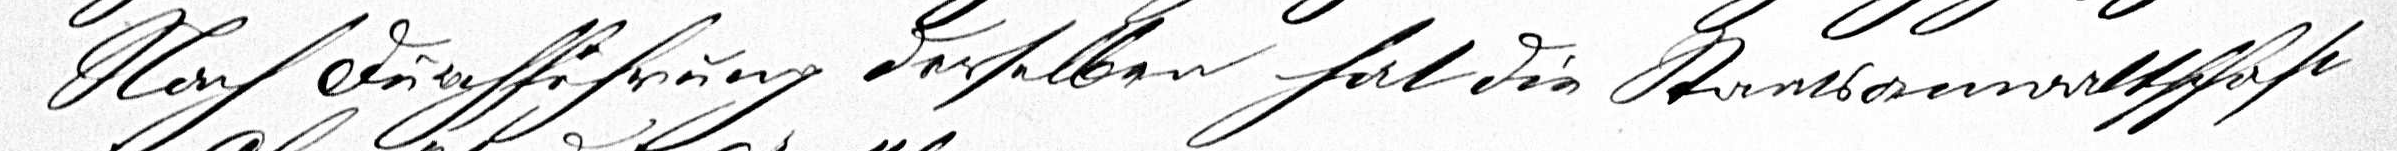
Nach Durchführung derselben hat die Staatsanwaltschaft
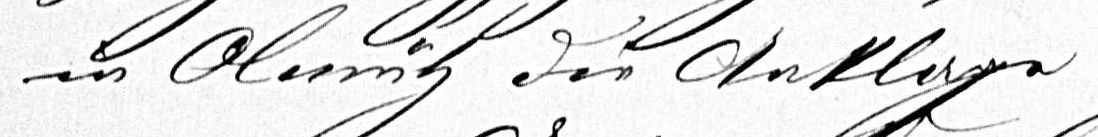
in Olmütz die Anklage
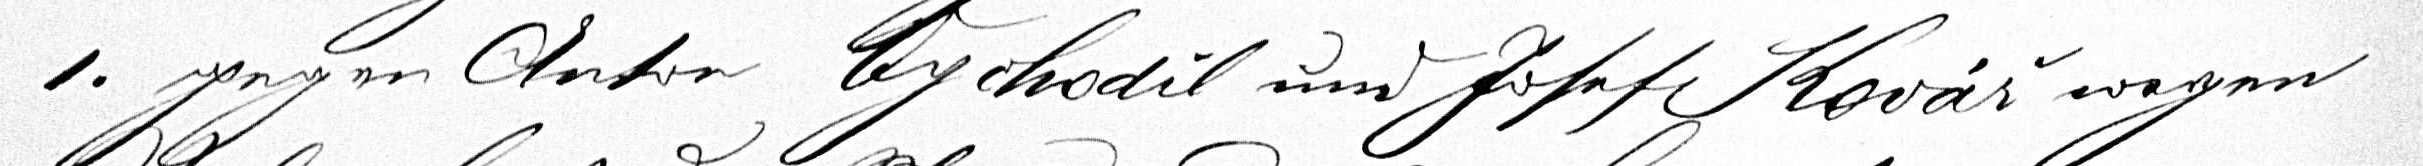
1. gegen Anton Vychodil und Josef Kovár wegen
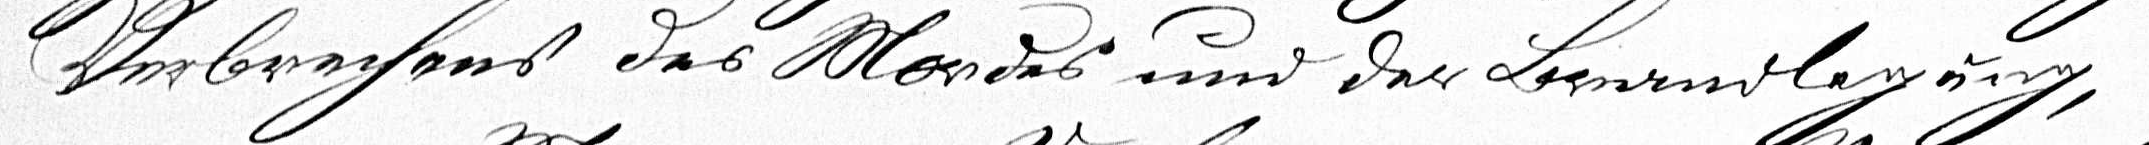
Verbrechens des Mordes und der Brandlegung,
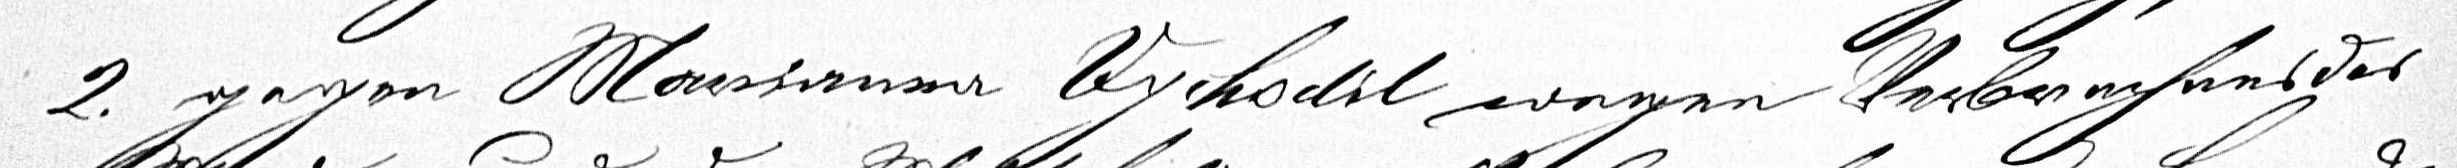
2. gegen Marianna Vychodil wegen Verbrechens des
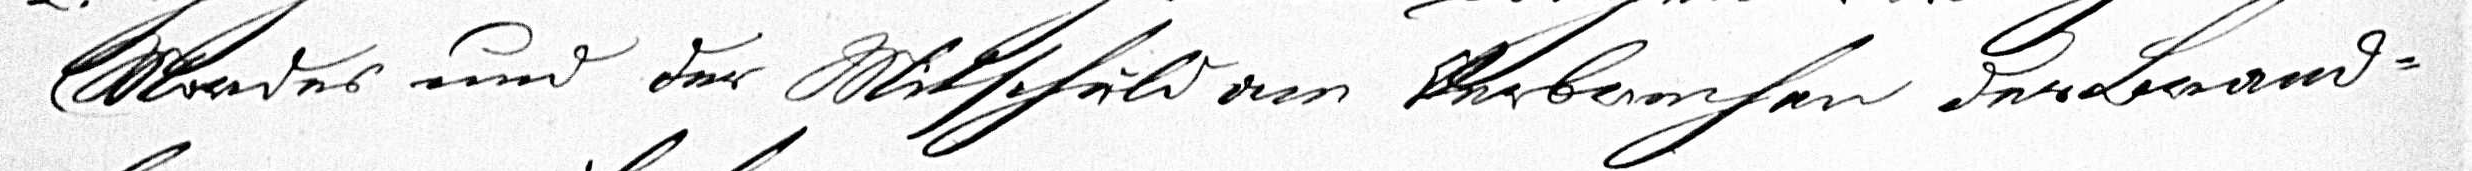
Mordes und der Mitschuld am Verbrachen der Brand¬
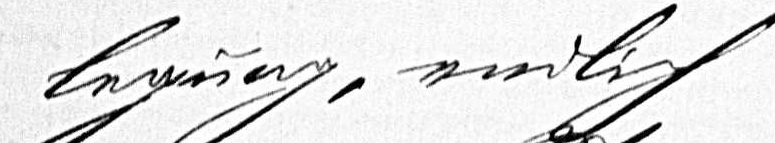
legung, endlich
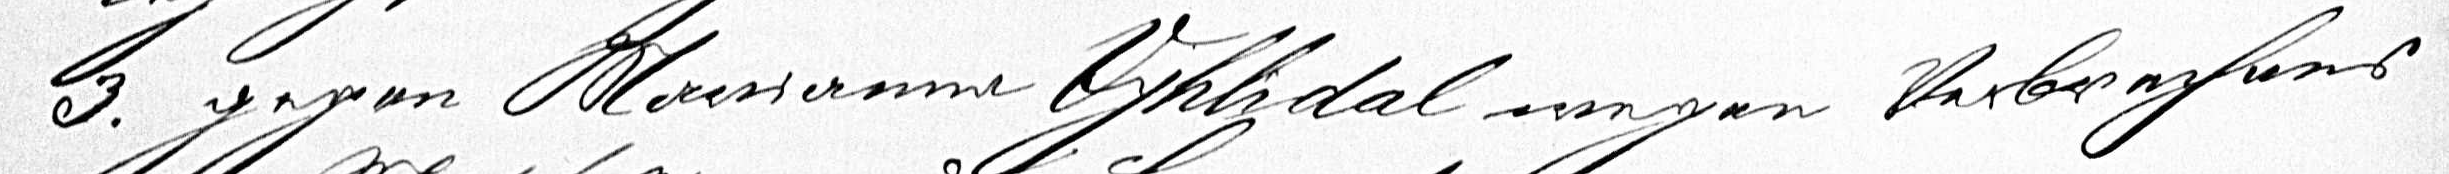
3. gegen Marianna Vyhlidal wegen Verbrechens
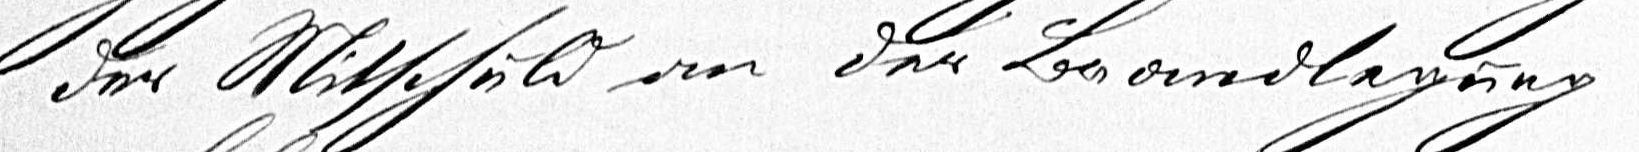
der Mitschuld an der Brandlegung
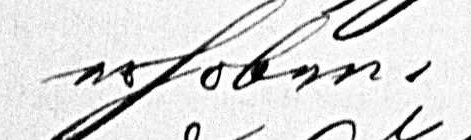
erhoben.
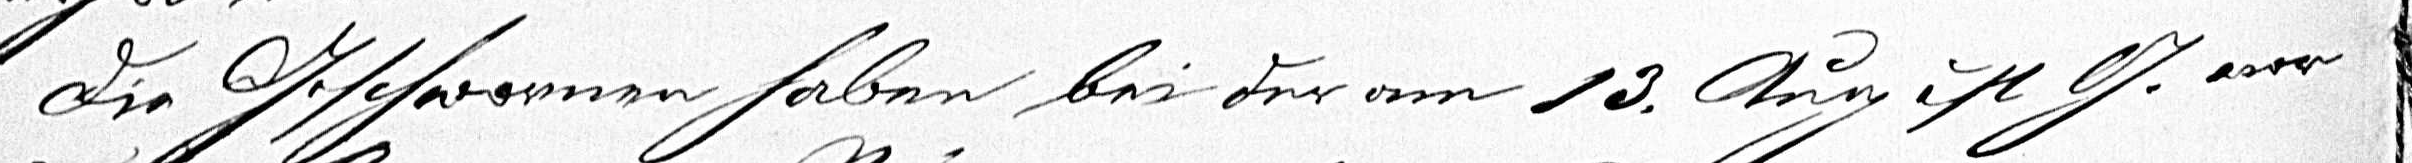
Die Geschwornen haben bei der am 13. Aug ist G. vor
